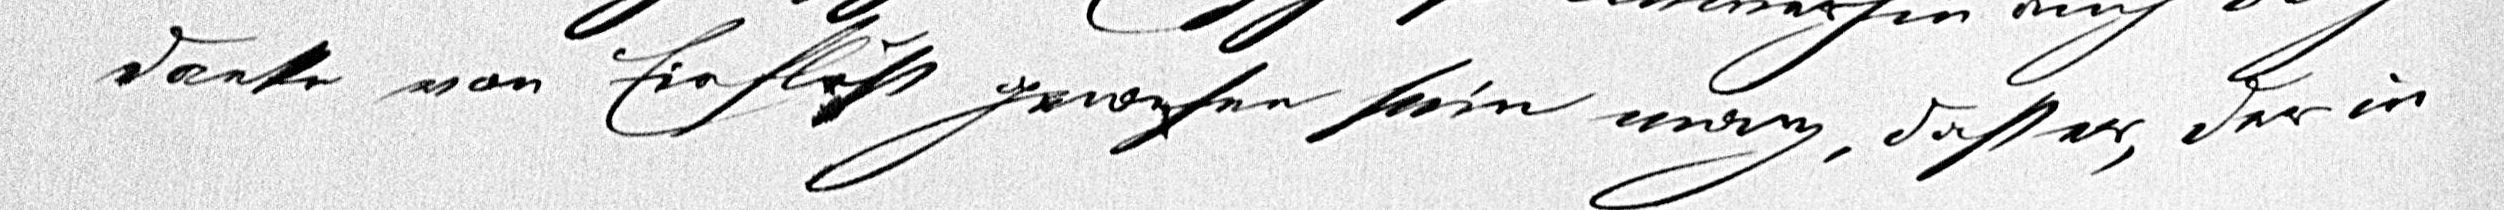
danke von Einfluß gewesen sein mag, daß er, der in
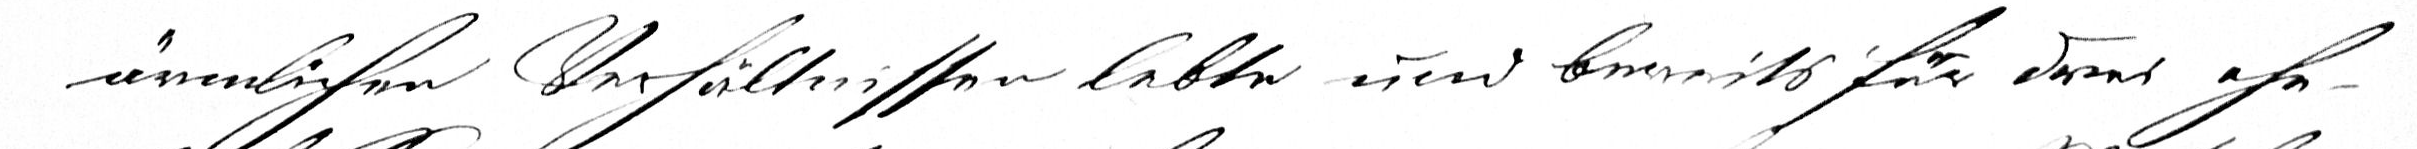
ärmlichen Verhältnissen lebte und bereits für drei ehe¬
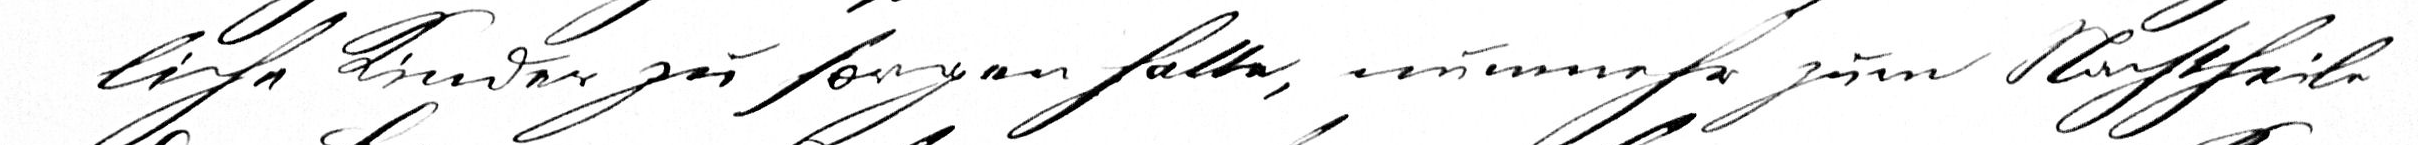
liche Kinder zu sorgen hatte, nunmehr zum Nachtheile
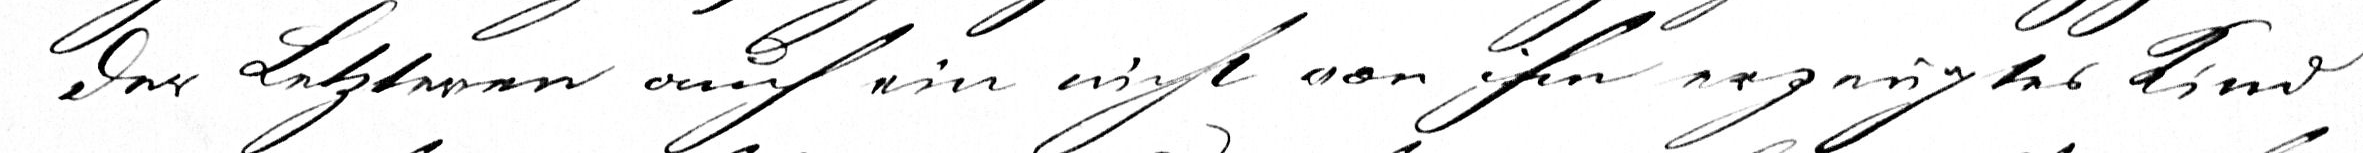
der Letzteren auch ein nicht von ihm erzeugtes Kind
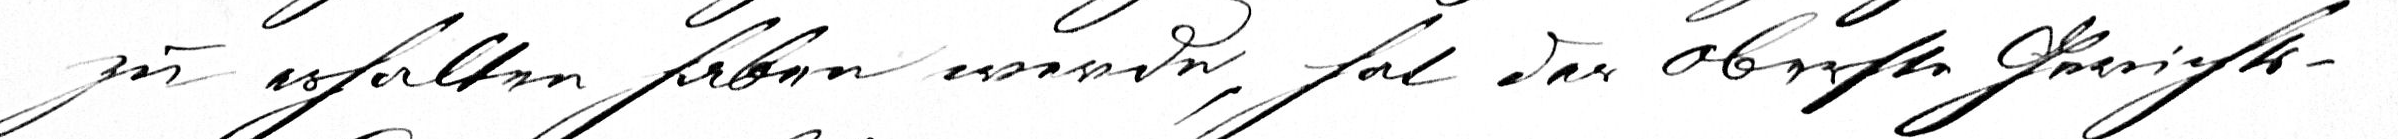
zu erhalten haben werde, hat der oberste Gerichts-
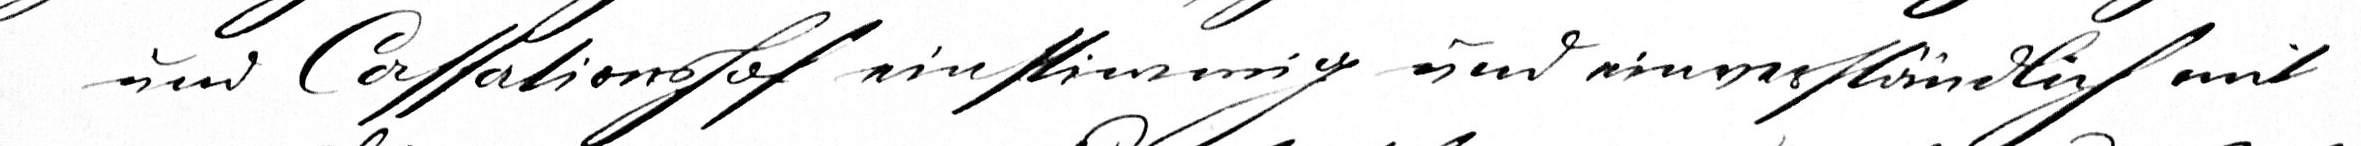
und Cassationshof einstimmig und einverständlich mit
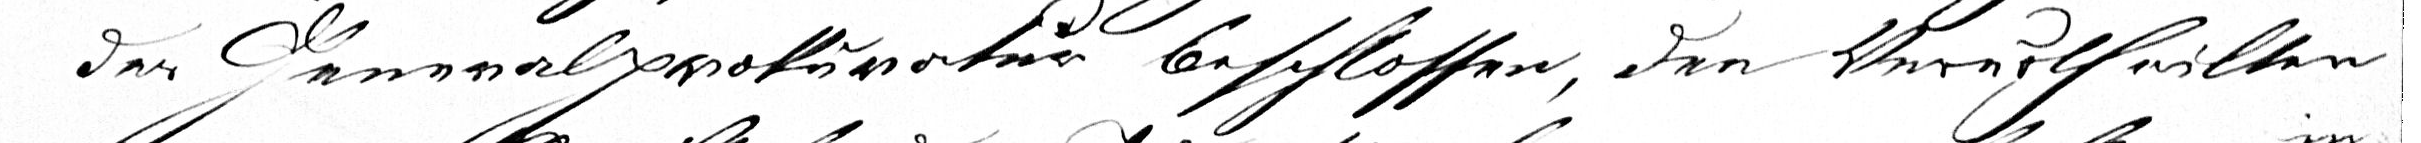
der Generalprokuratur beschlossen, den Verurtheilten
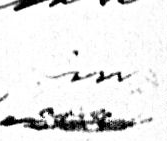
in
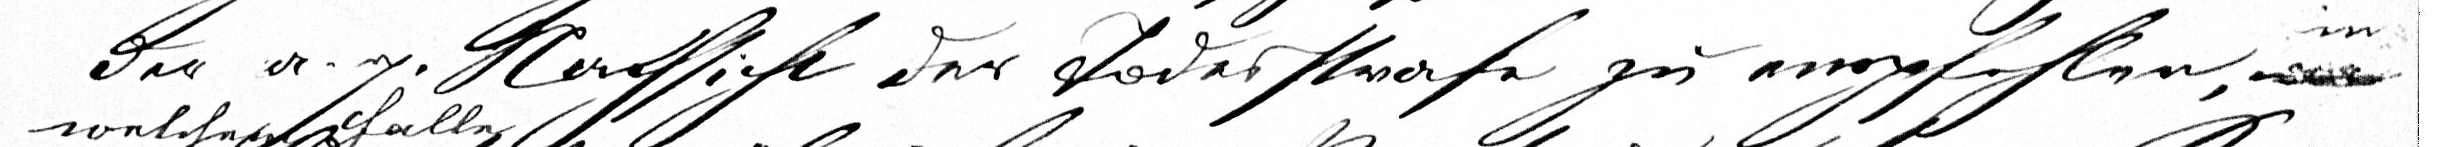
der a. g. Nachsicht der Todesstrafe zu empfehlen,
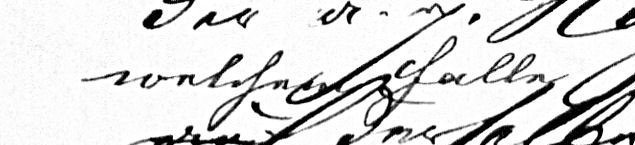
welchem Falle
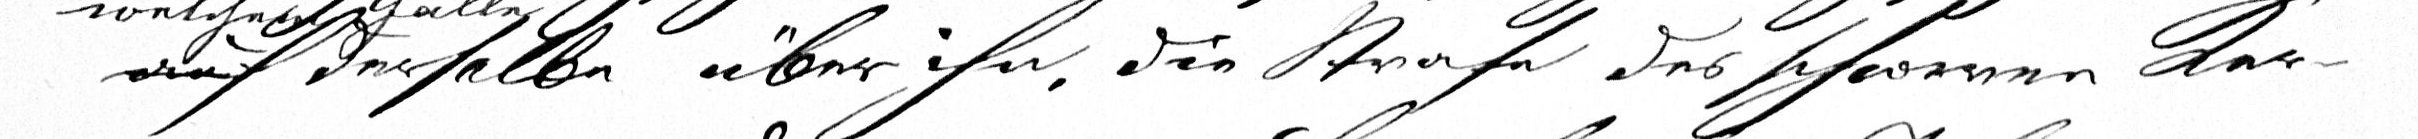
derselbe über ihn, die Strafe des schweren Ker¬
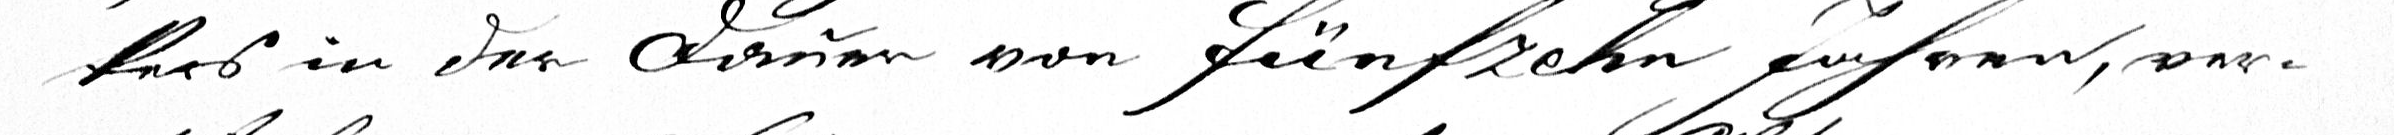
kers in der Dauer von fünfzehn Jahren, ver¬
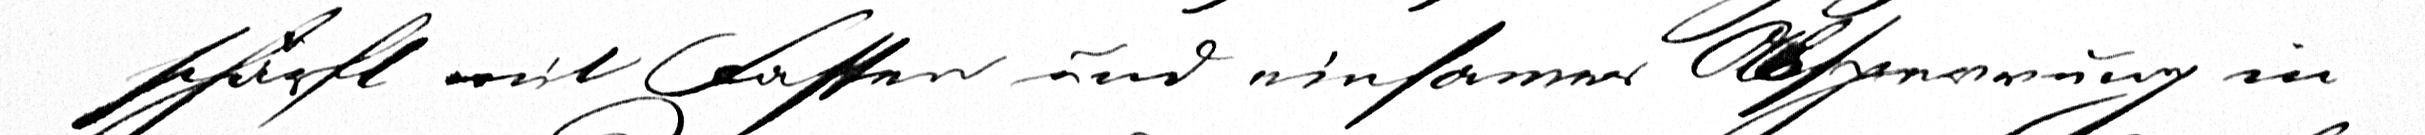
schärft mit Fasten und einsamer Absperrung in
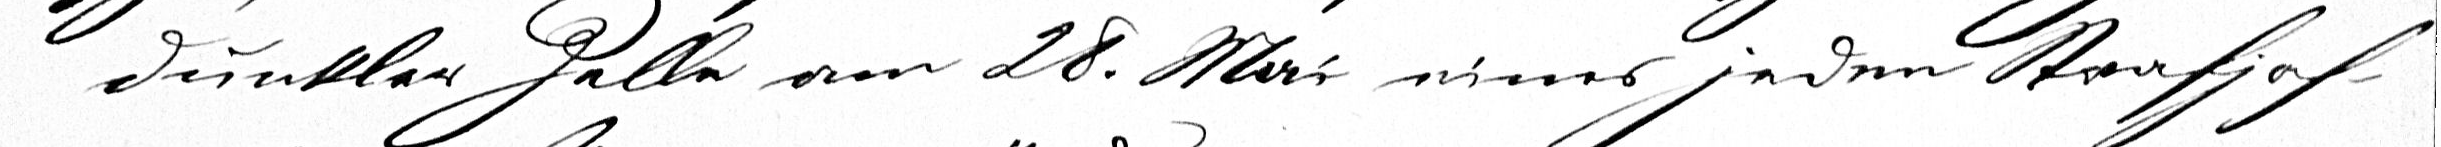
dunkler Zelle am 28. Mai eines jeden Strafjah¬
